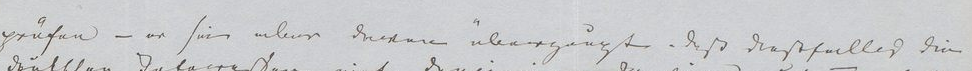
prüfen, er sei aber davon überzeugt, daß dießfalls die
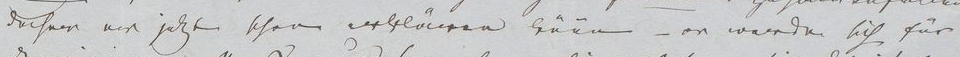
daher er jetzt schon erklären könne, er werde sich für
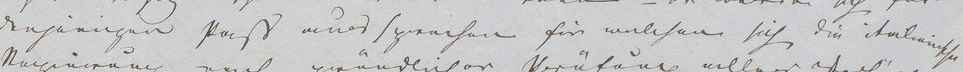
denjenigen Paß aussprechen für welchen sich die italienische
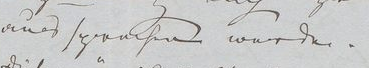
aussprechen werde. –
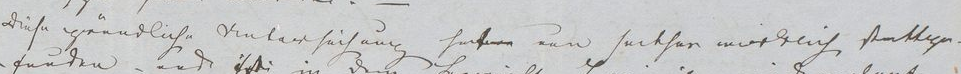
Diese gründliche Untersuchung hat nun seither wirklich stattge-
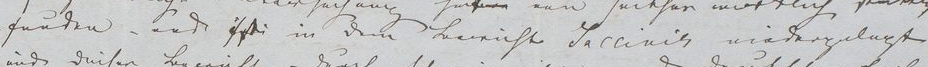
funden, und ist in dem Bericht Jaccinis niedergelegt
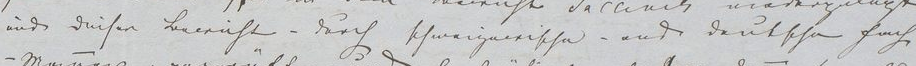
und dieser Bericht, durch schweizerische und deutsche Fach-
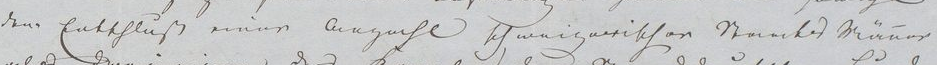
dem Entschluß einer Anzahl schweizerischer StaatsMänner
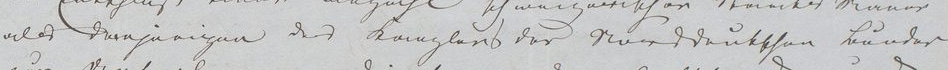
als demjenigen des Kanzlers der Norddeutschen Länder
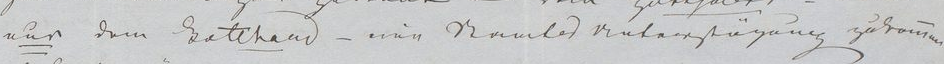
nur dem Gotthard, eine Staats Unterstüzung zukommen
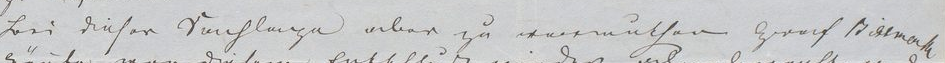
Bei dieser Sachlage aber zu vermuthen Graf Bissmark
